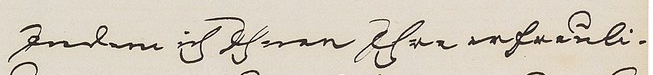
Indem ich Ihnen Ihre erfreuli-
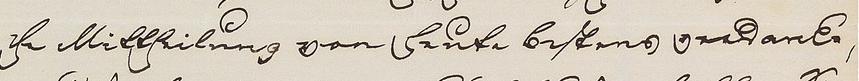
che Mittheilung von heute bestens verdanke,
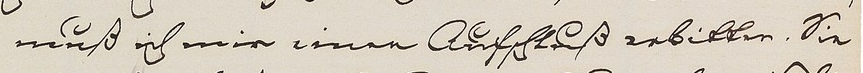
muß ich mir einen Aufschluß erbitten. Sie
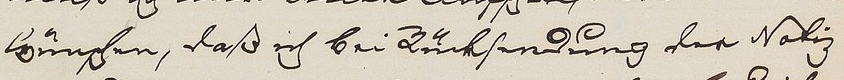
wünschen, daß ich bei Rücksendung der Notiz
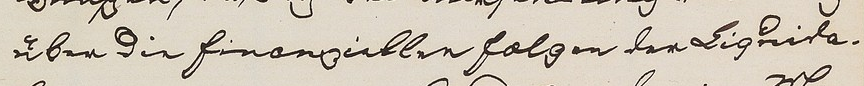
über die finanziellen Folgen der Liquida-
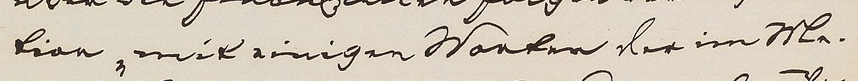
tion «mit einigen Worten der im Me-
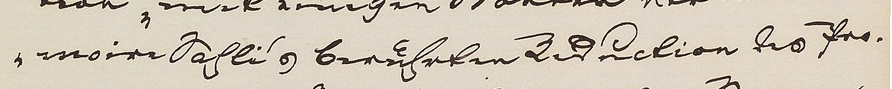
moire Sahli's berührten Reduction des Pro-
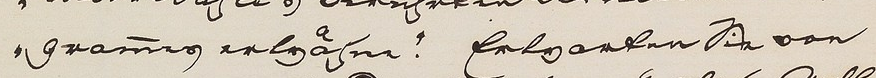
grammes erwähne». Erwarten Sie von
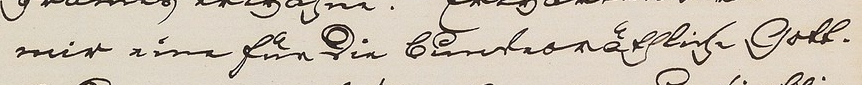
mir eine für die bundesräthliche Gott-
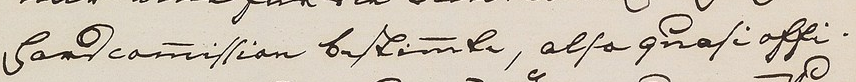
hardcommission bestimmte, also quasi offi-
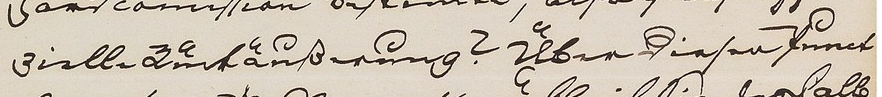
zielle Rückäußerung? Über diesen Punct
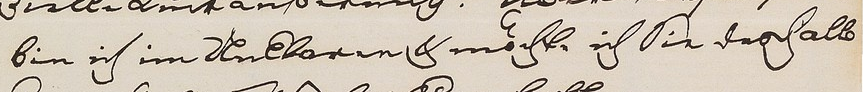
bin ich im Unklaren & möchte ich Sie deshalb
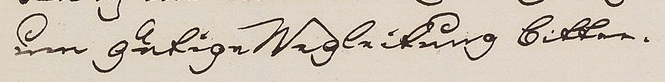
um gütige Wegleitung bitten.
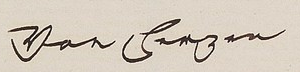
Von Herzen
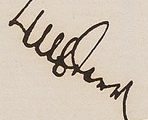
Escher
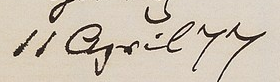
11 April 77
